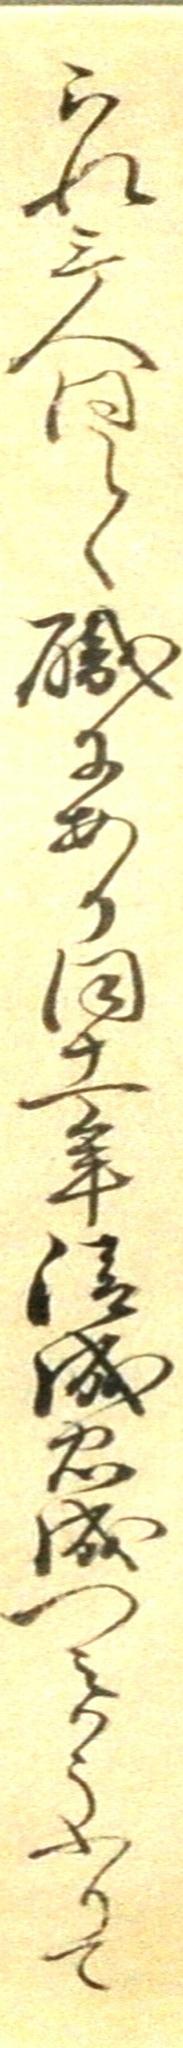られ三人同しく職にあり同十一年清成忠成つみかうふりて
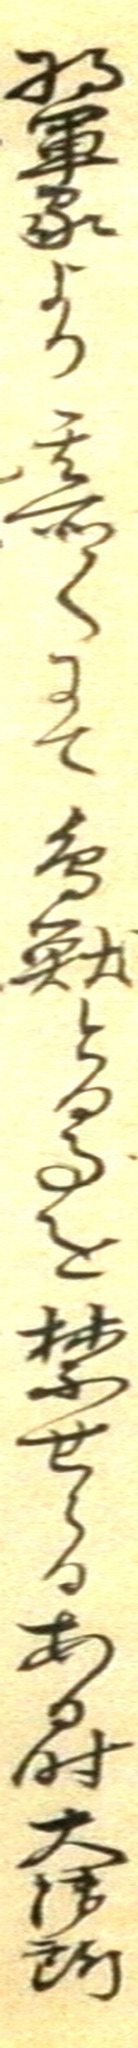将軍家より其所〳〵にて鳥獣とる事を禁せられるある時大御所
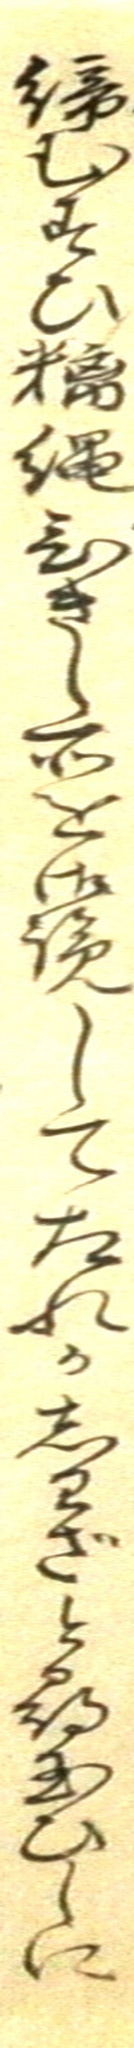締むすひ縄ひきし所を御覧してたれかしわざと尋玉ひしに
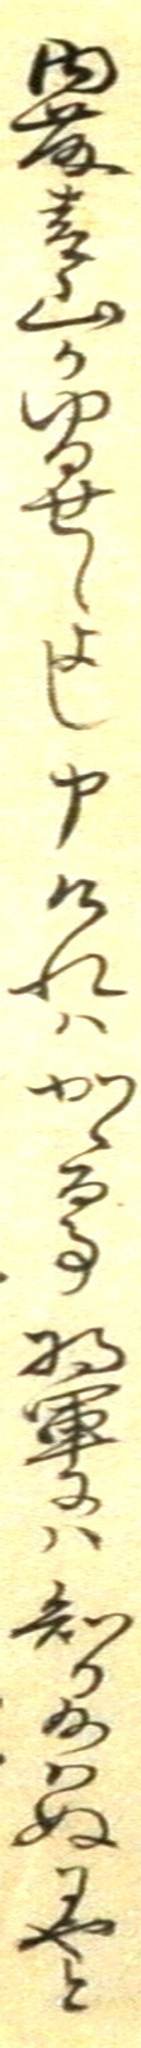内藤青山かゆるせしよし申けれはかゝる事将軍には知り給はぬにやと
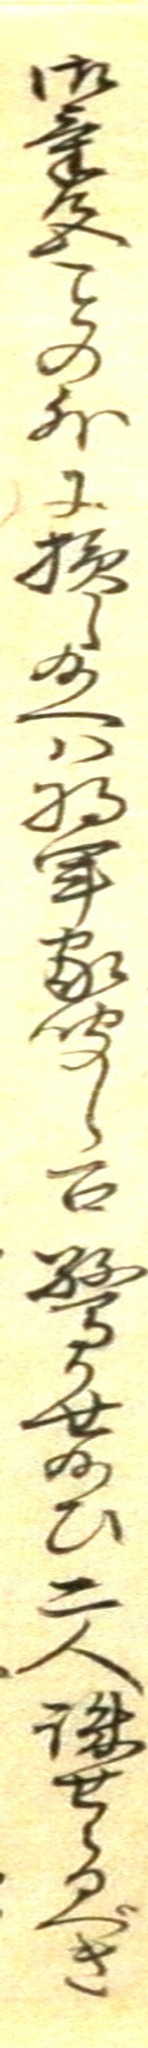御気色ことの外に損し給へは将軍家聞し召驚かせ給ひ二人誅せらるべき
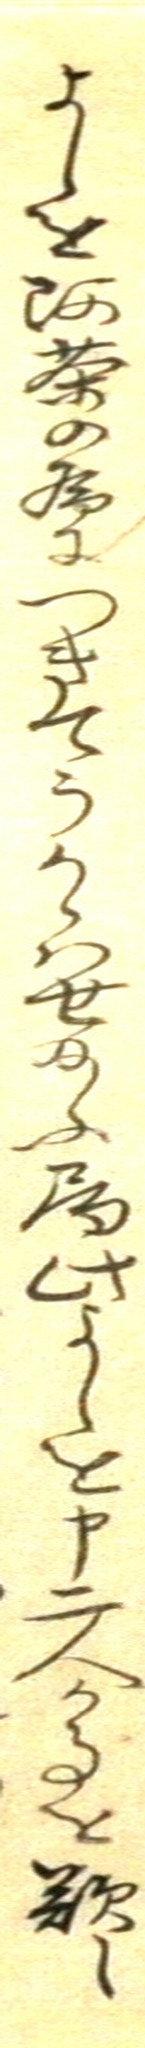よしを阿茶の局につきてうかゝはせ給ふ局此よしを申二人か事を歎し
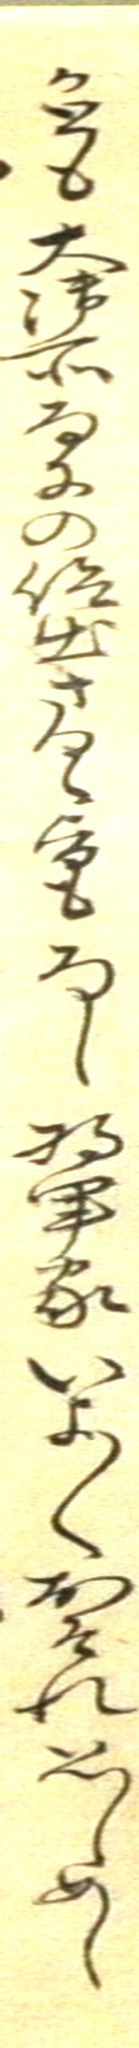かとも大御所なにの仰出さるゝ旨もなし将軍家いよ〳〵おそれ思しめし
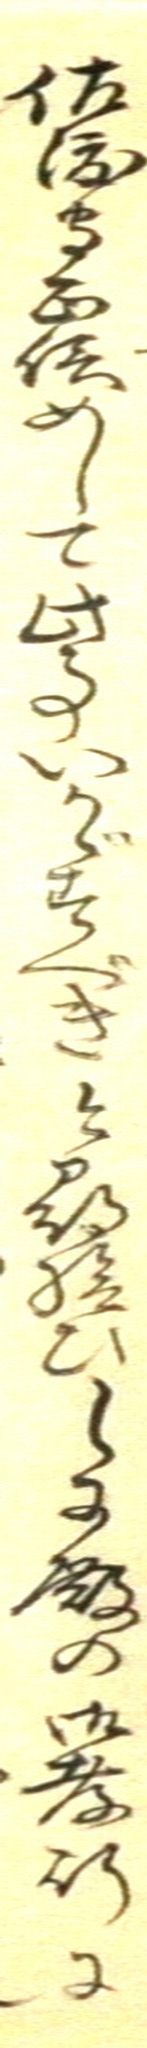佐渡守正信めして此事いかゞすべきと尋給ひしに殿の御孝行に
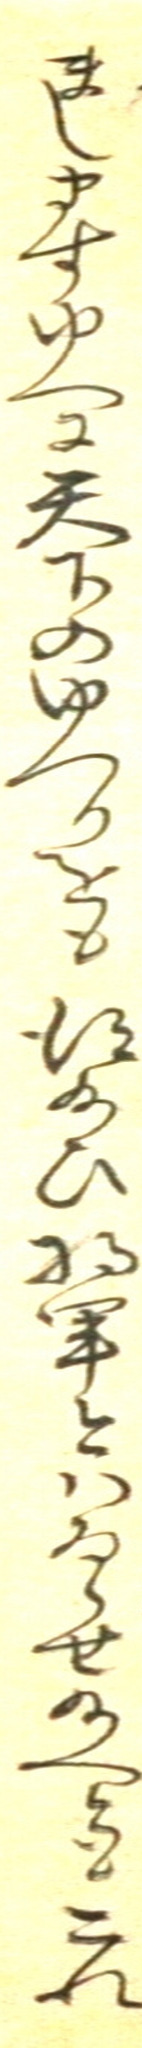ましますゆへに天下のゆつりをも得給ひ将軍とはならせ給へともこれ
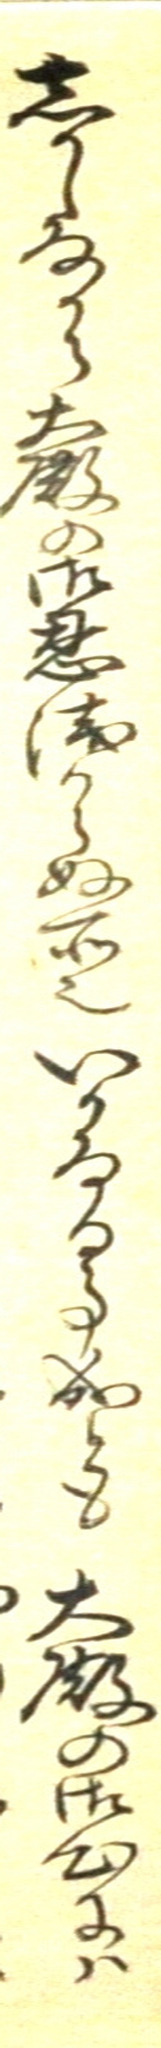しかしなから大殿の御恩浅からぬ所也いかなる事成とも大殿の御心には
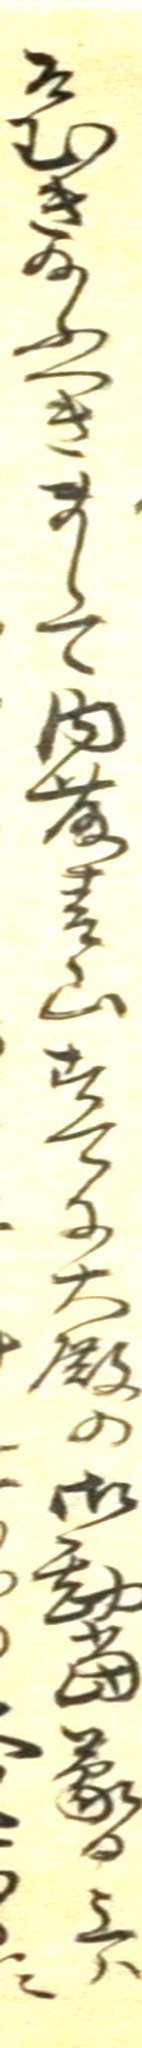そむき給ふへきまして内藤青山すてに大殿の御勘当蒙る上は
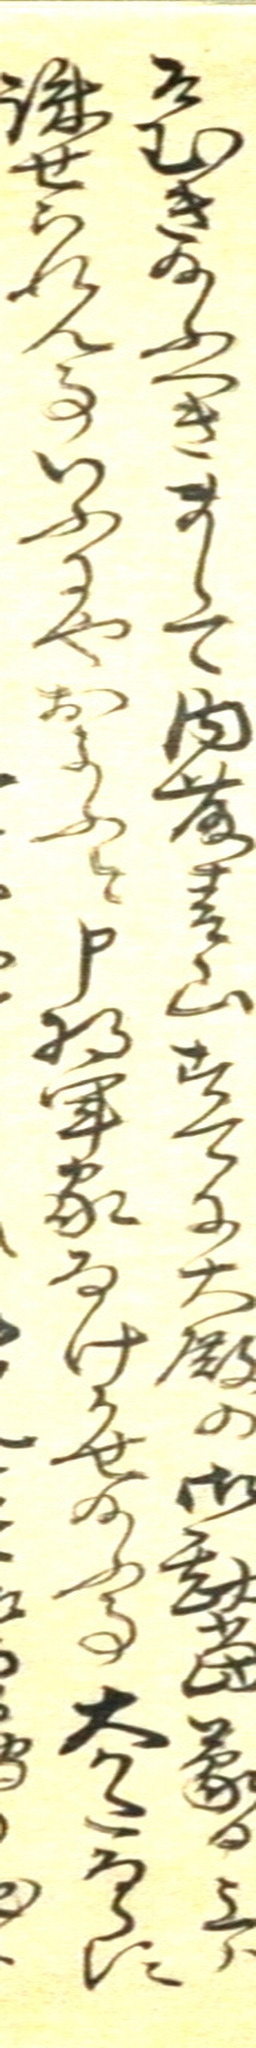誅せられん事いふにやおよふと申将軍家なけかせ給ふ事大かたならす
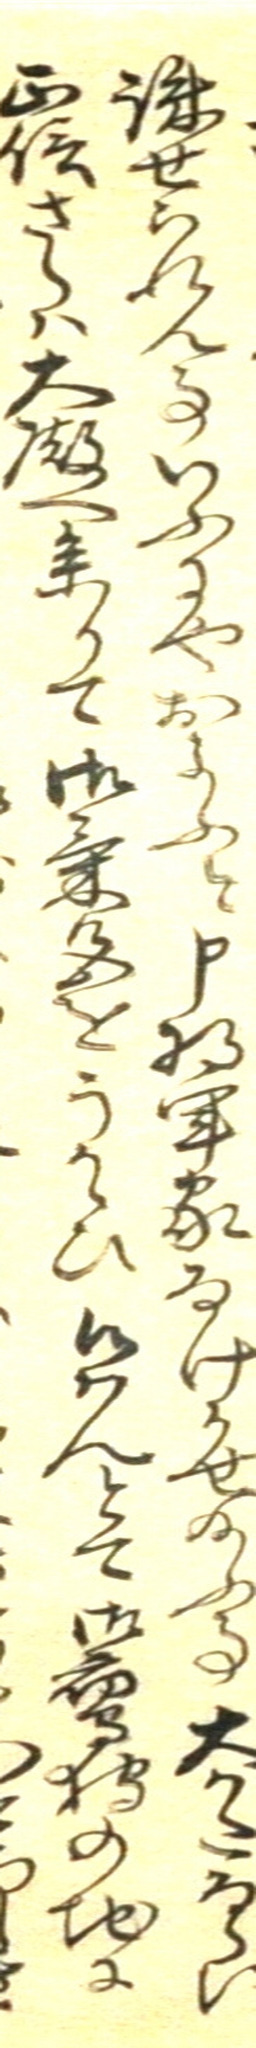正信さらは大殿へ参りて御気色をうかゝひ候はんとて御鷹狩の地に
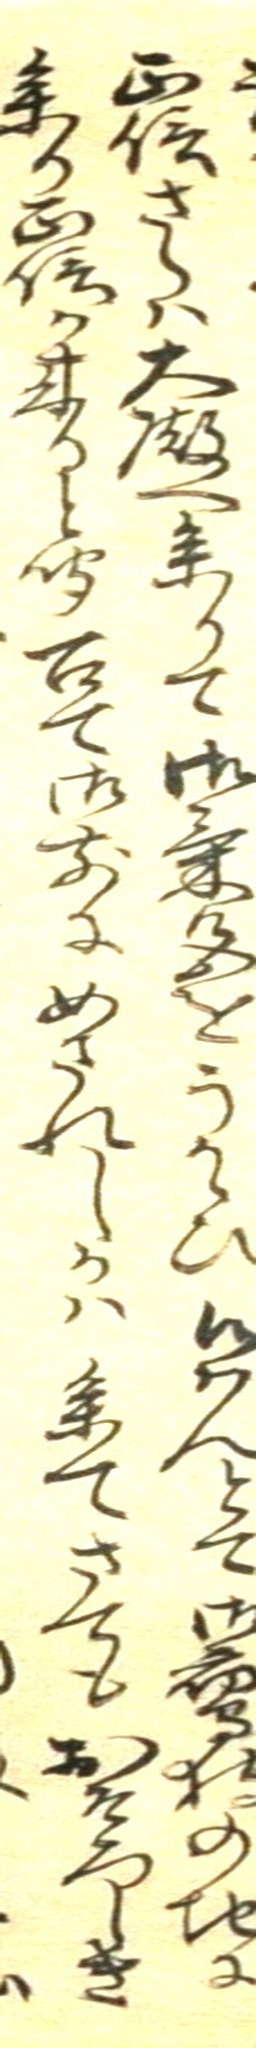参り正信か来ると聞召て御前にめされしかは参てさてもおそろしき
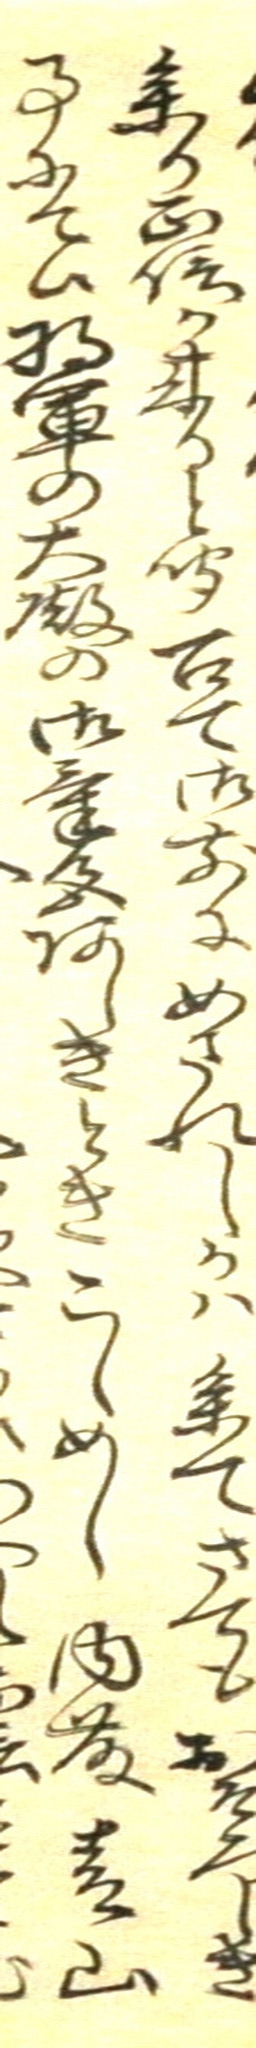事にて候将軍の大殿の御気色あしきときこしめし内藤青山
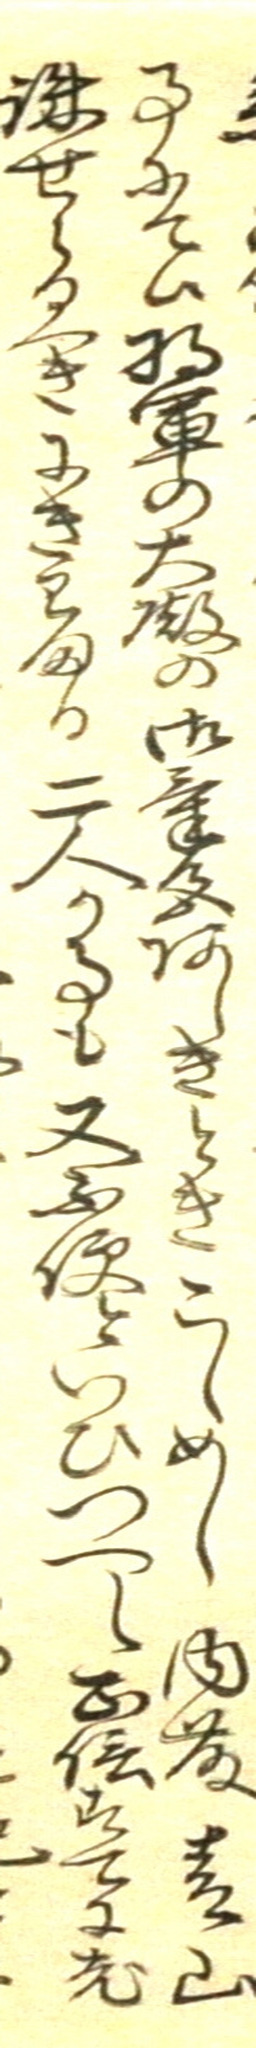誅せらるへきにきわまる二人か事も又不便といひつへし正信すてに老
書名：藩翰譜（四・中）
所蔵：伊那市立高遠町図書館・合同会社AMANE
